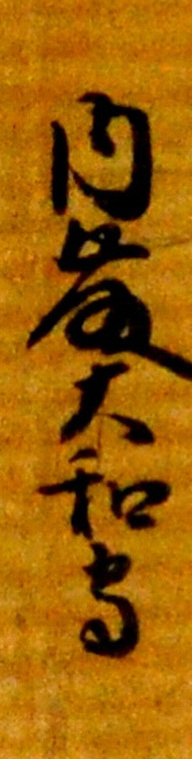内藤大和守

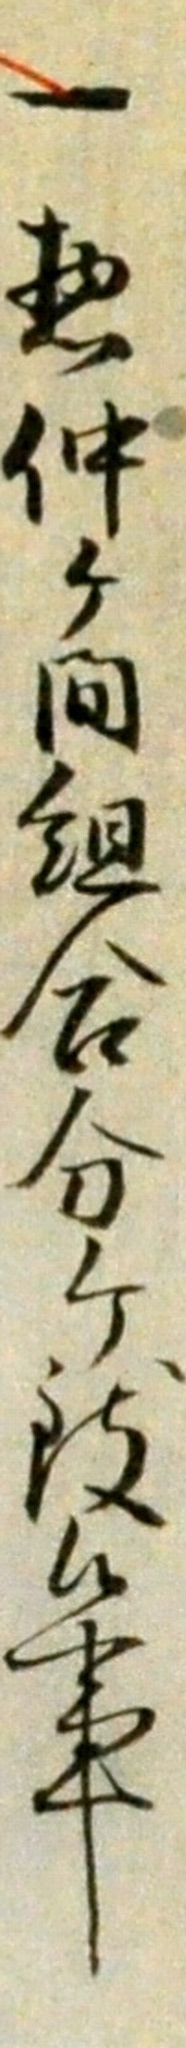一惣仲ヶ間組合分ケ致候事
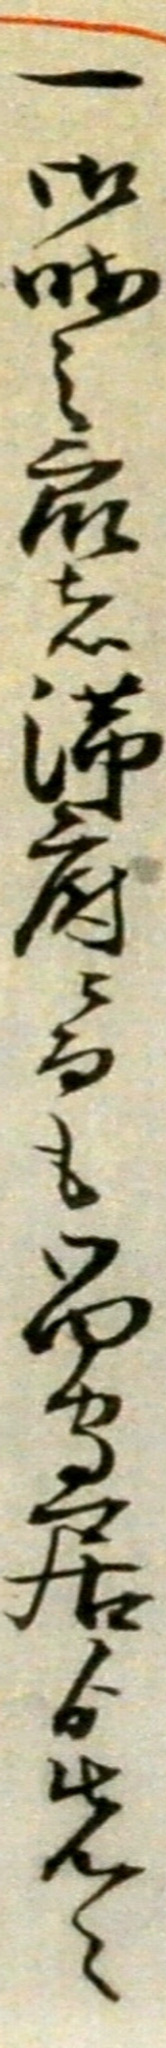一御暇之衆は滞府にても留守居ゟ先々
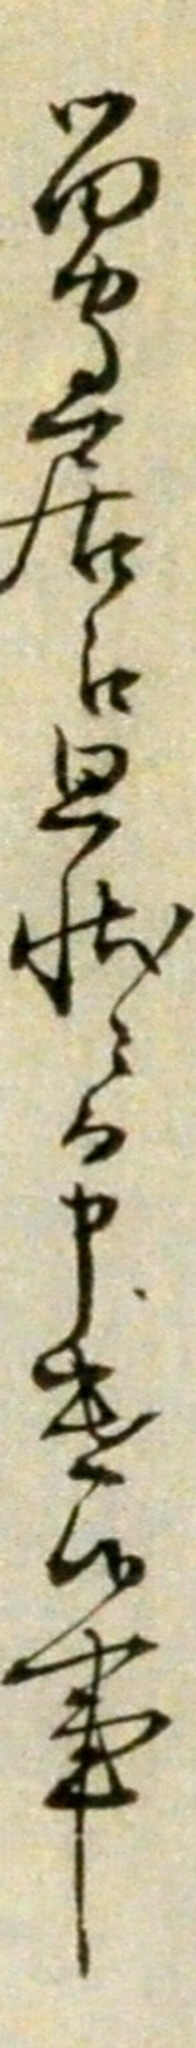留守居え廻状にて申遣候事
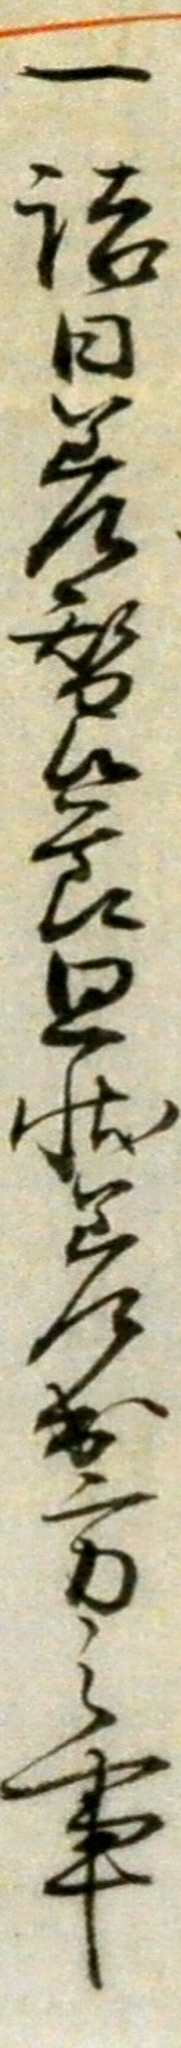一詰日差替候節廻状差出方之事
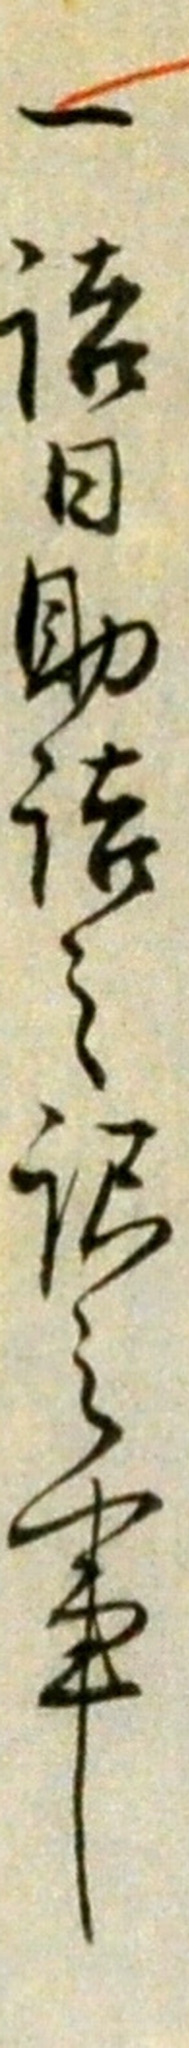一詰日助詰之訳之事
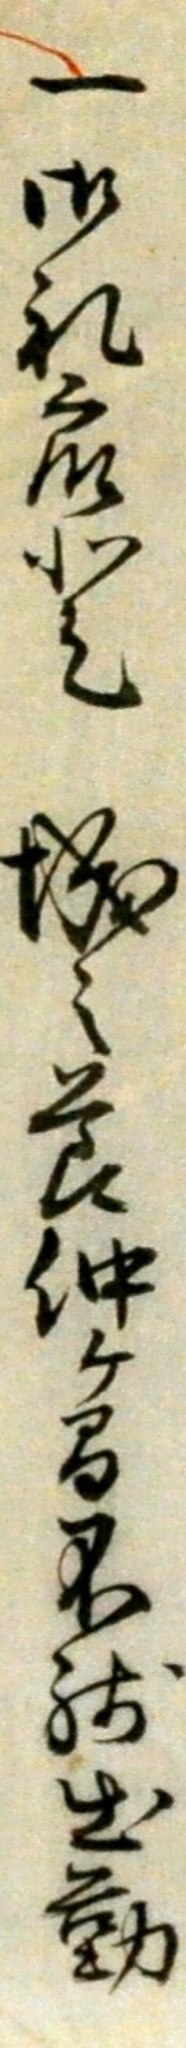一御礼衆登城之節仲ヶ間不残出勤
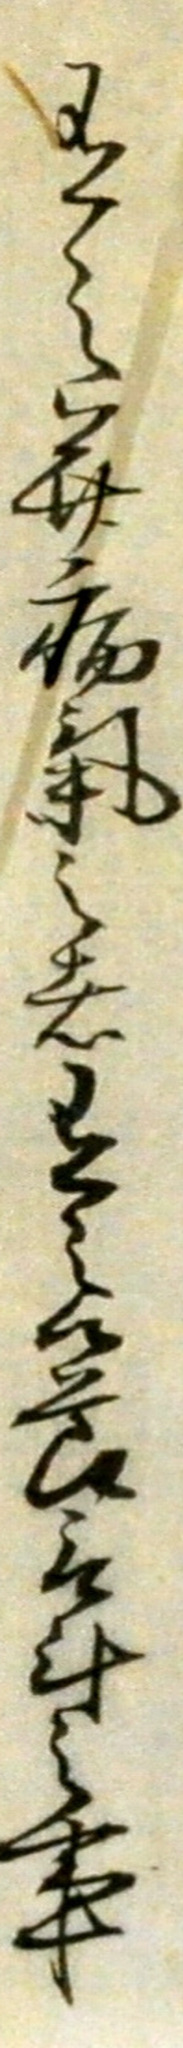有之并病気之者有之候節取斗之事
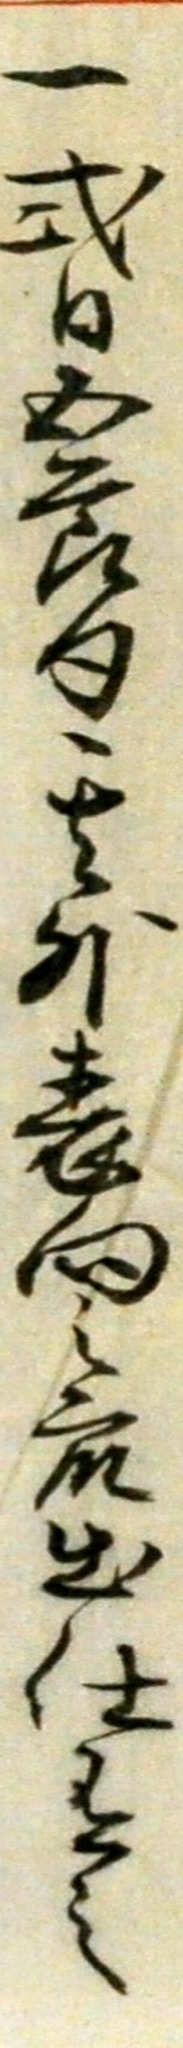一式日五節句其外表向之衆出仕有之
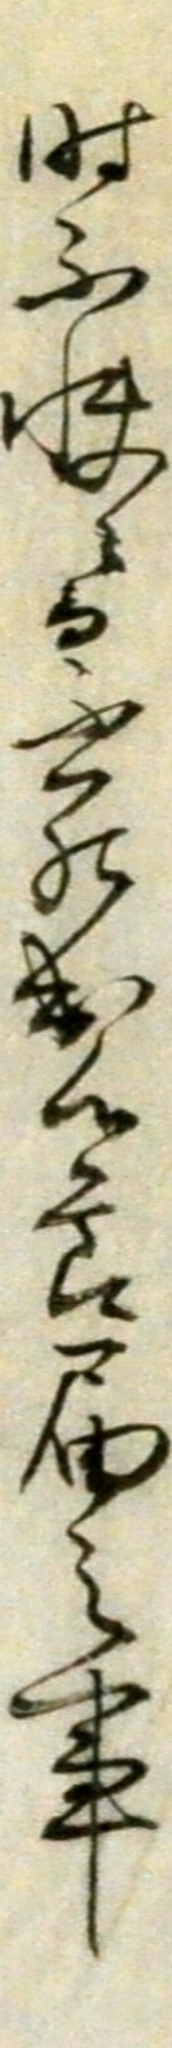時不快にて不罷出候節届之事
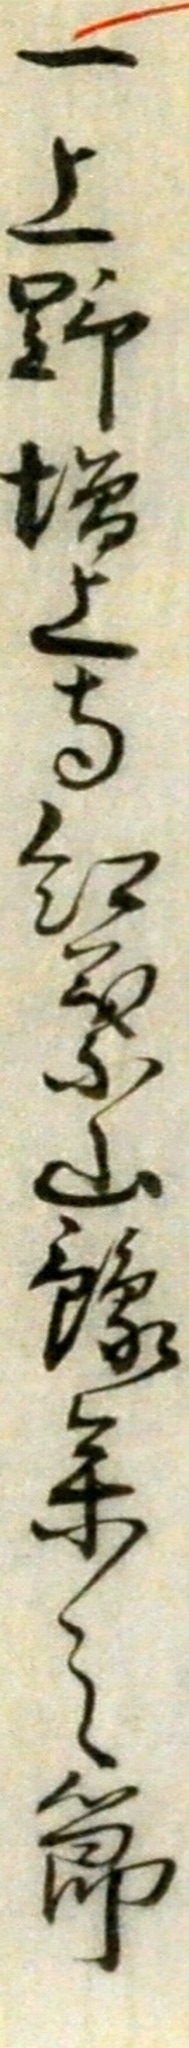一上野増上寺紅葉山予参之節
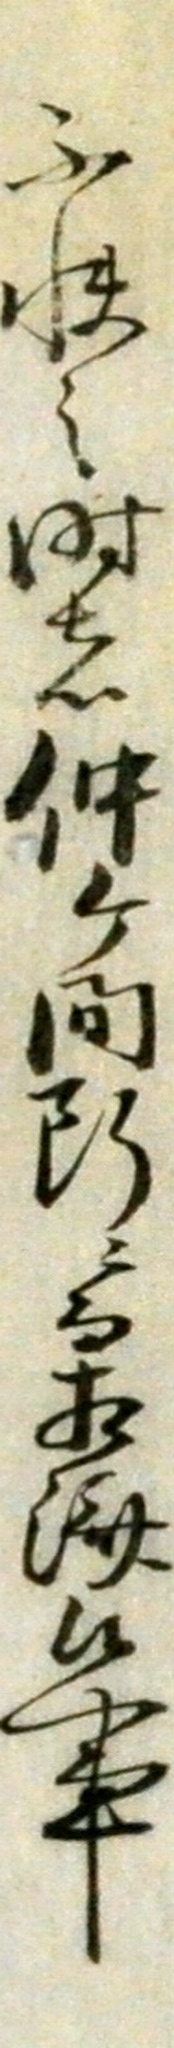不快之時は仲ヶ間断にて相済候事
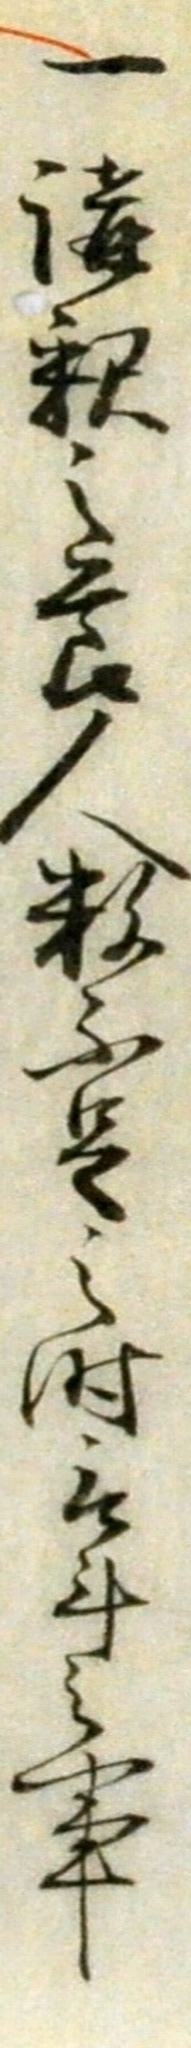一講釈之節人数不足之時取斗之事
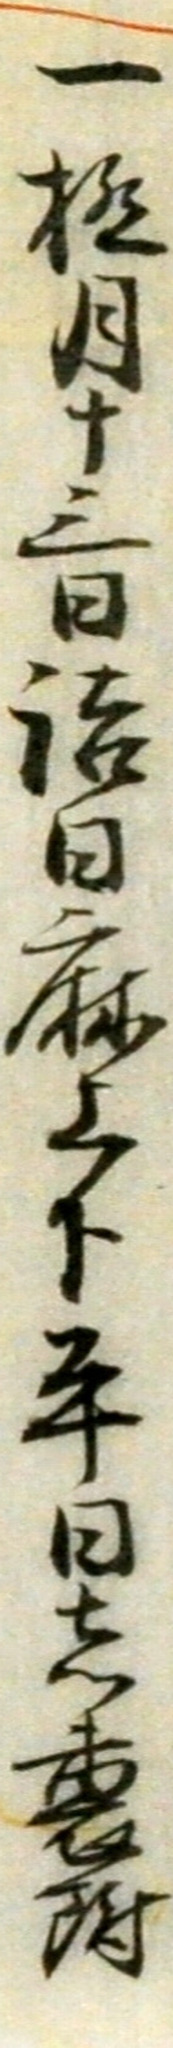一極月十三日詰日麻上下平日は裏附
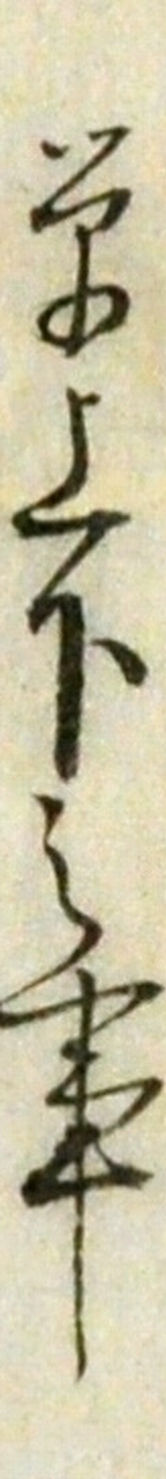単上下之事
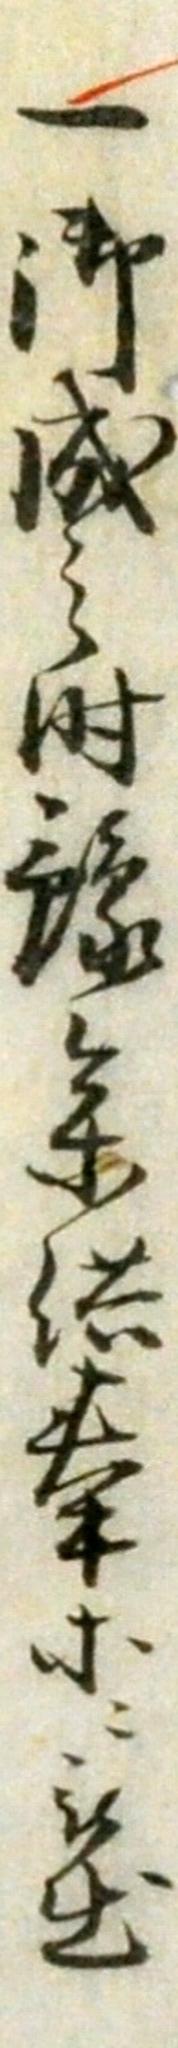一御成之時予参供奉等に被出
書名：申合帳〔一括〕
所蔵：伊那市立高遠町図書館・合同会社AMANE
